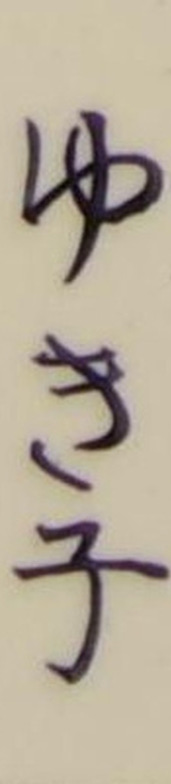ゆき子
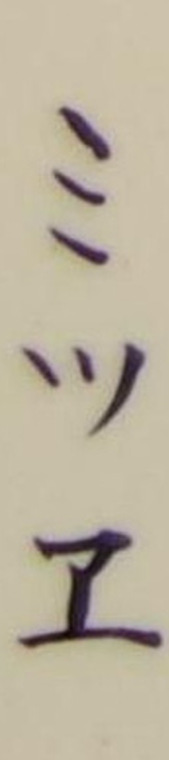ミツヱ

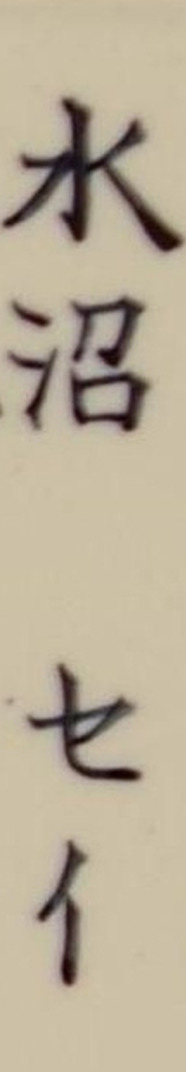水沼セイ
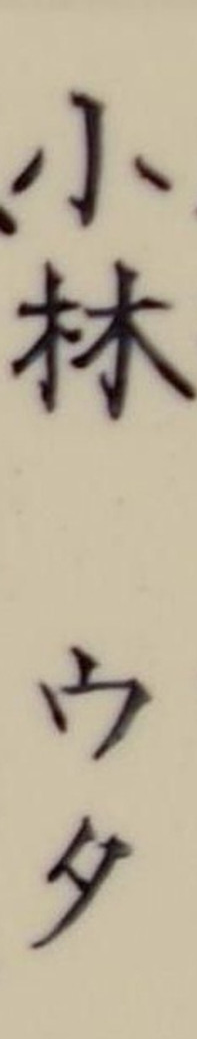小林ウタ
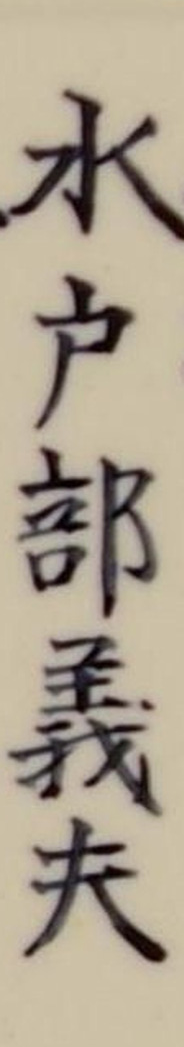水戸部義夫
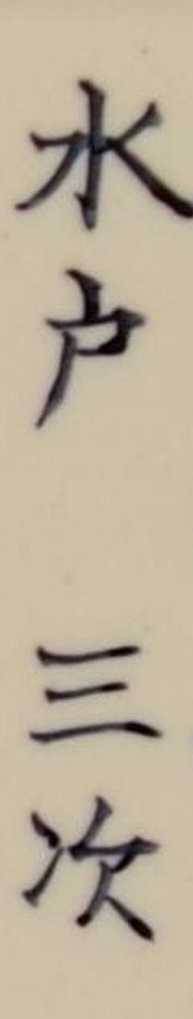水戸三次
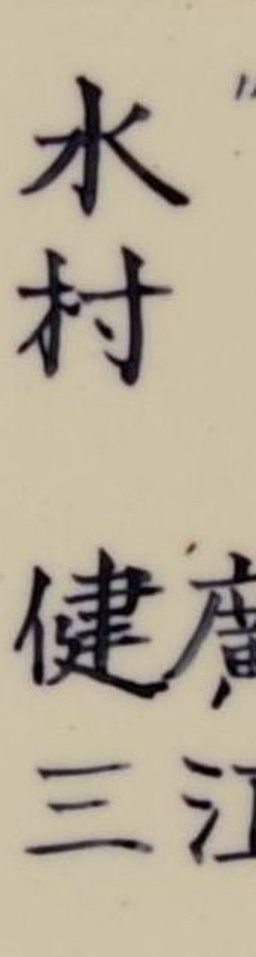水村健三
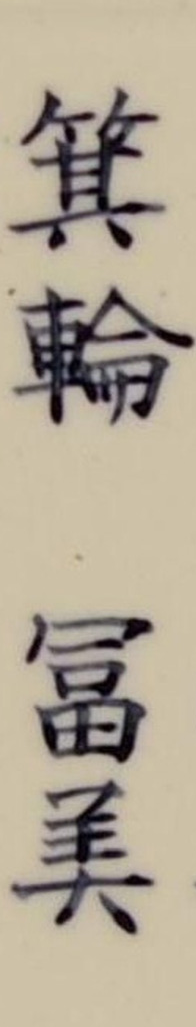箕輪冨美
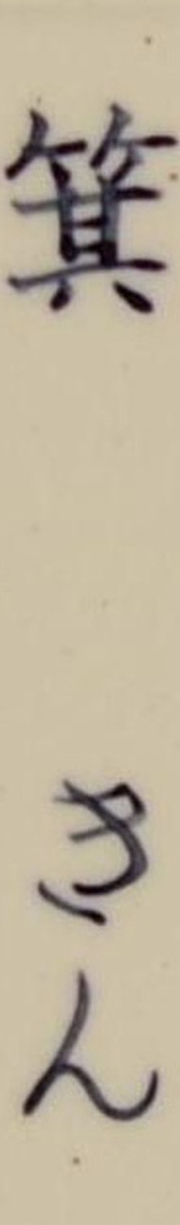箕きん
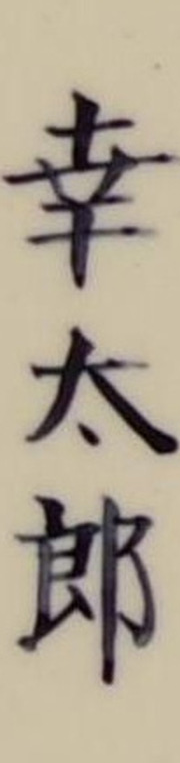幸太郎
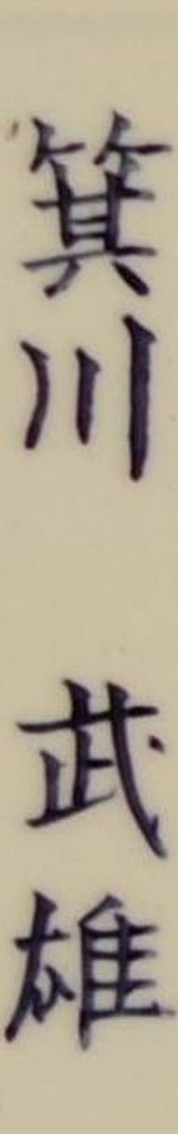箕川武雄
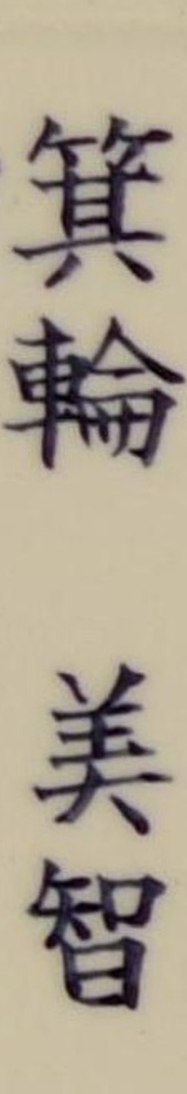箕輪美智
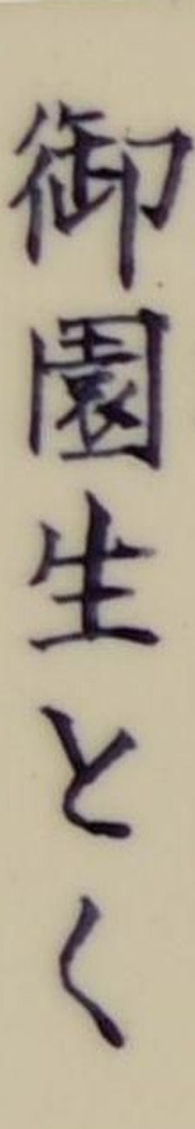御園生とく

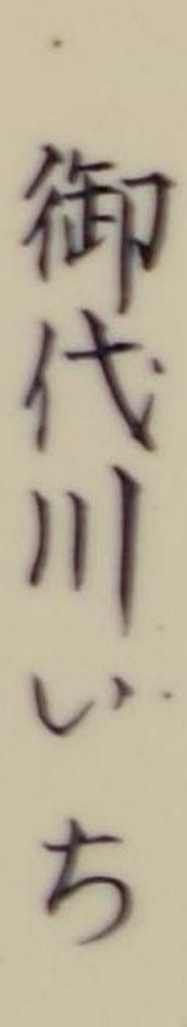御代川いち
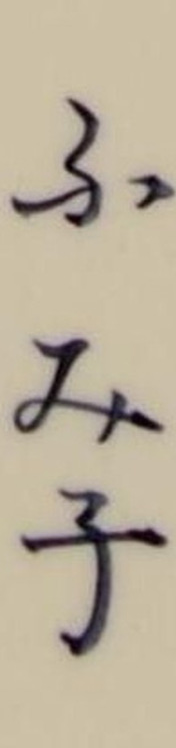ふみ子
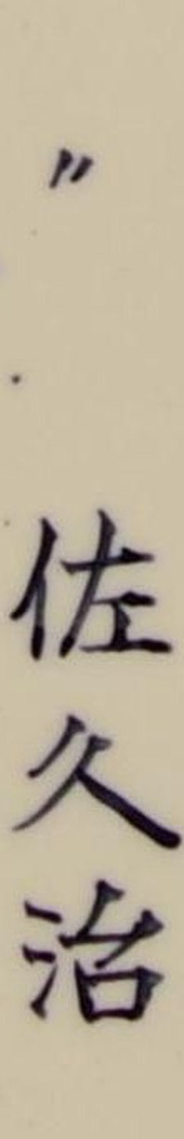佐久治
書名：E~L
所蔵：高野山金剛峯寺
